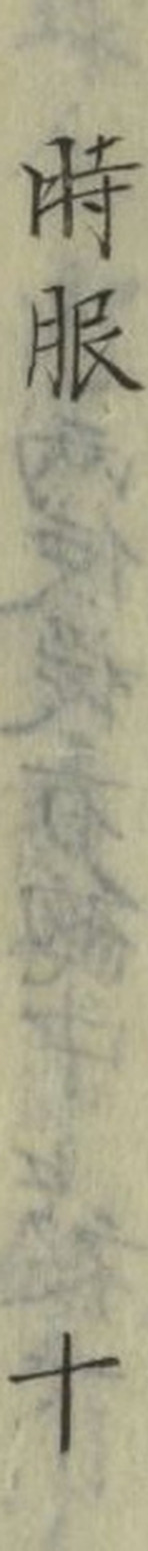時服十

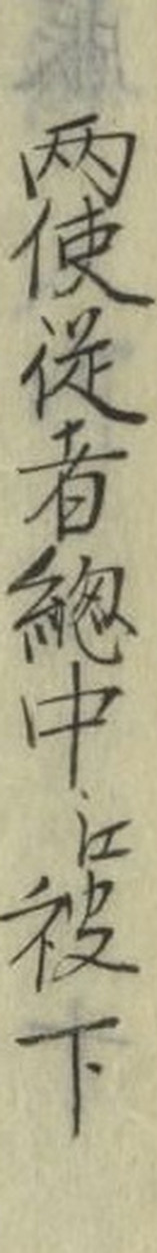両使従者総中え被下
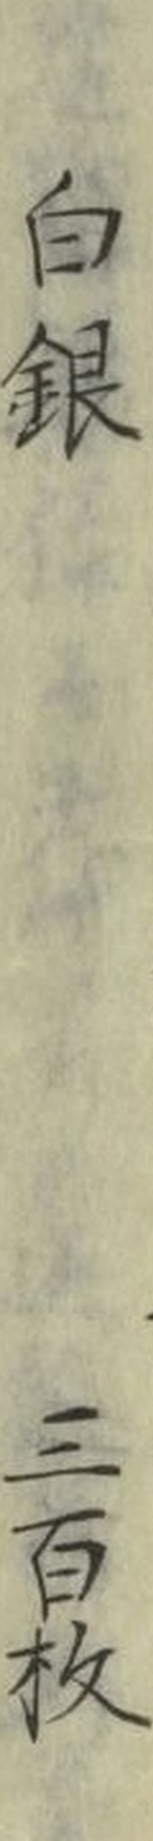白銀三百枚
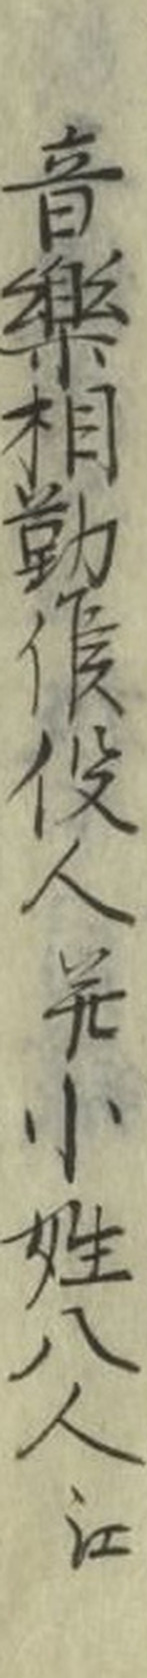音楽相勤候役人幷小姓八人え
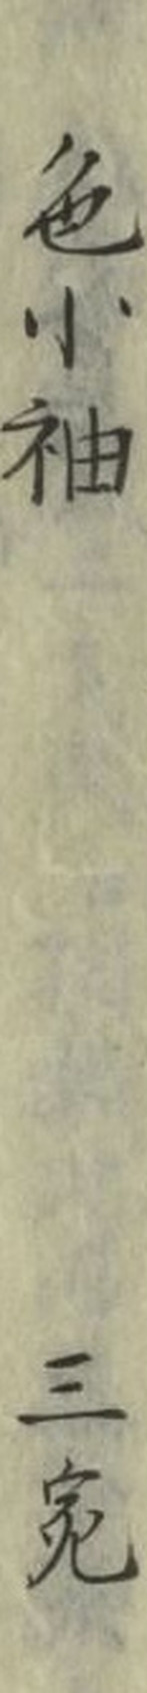色小袖三宛
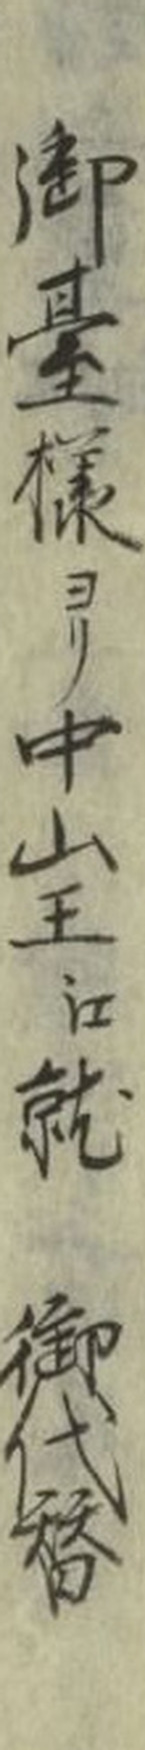御台様より中山王え就御代替
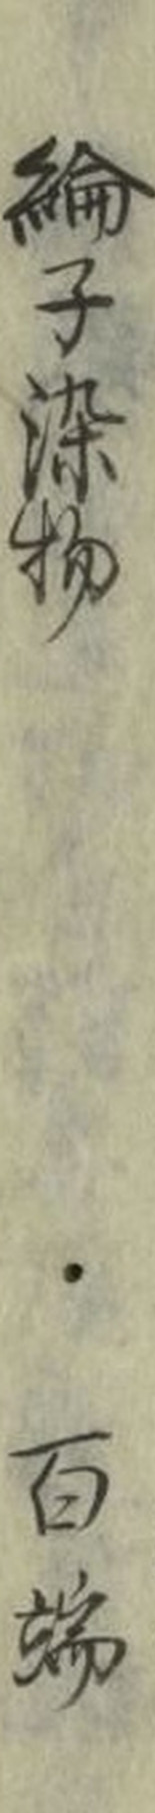綸子染物百端
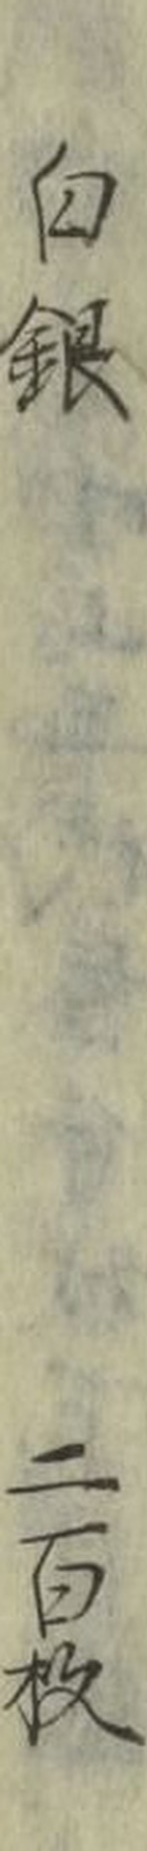白銀二百枚
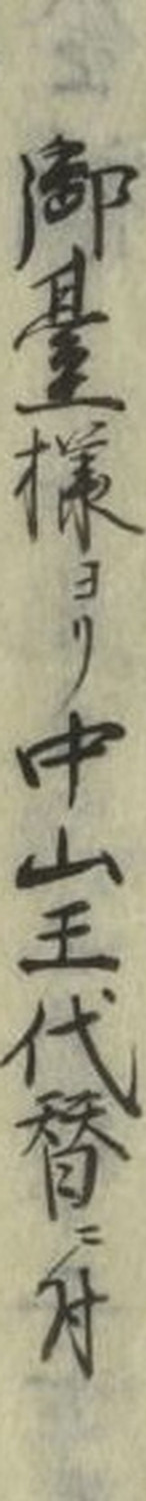御台様より中山王代替に付
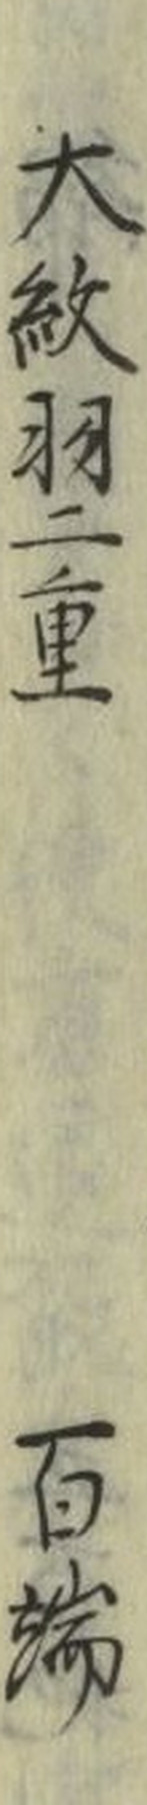大紋羽二重百端
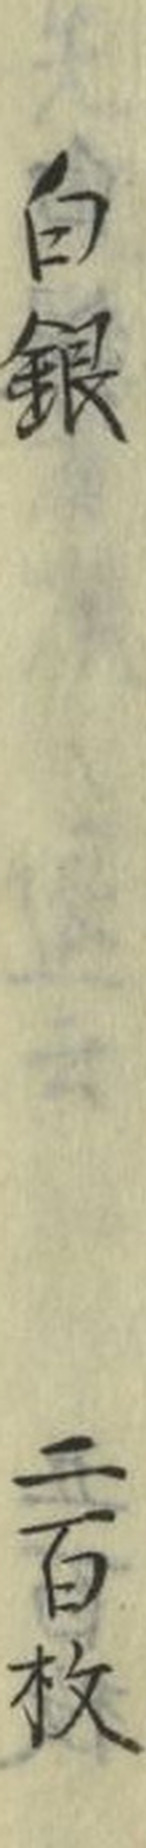白銀二百枚
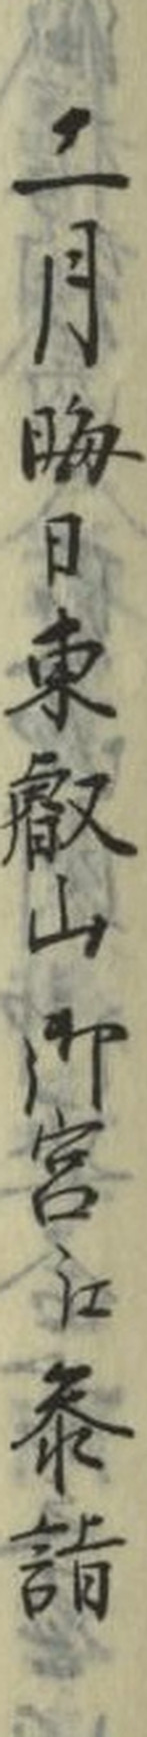十一月晦日東叡山御宮え参詣
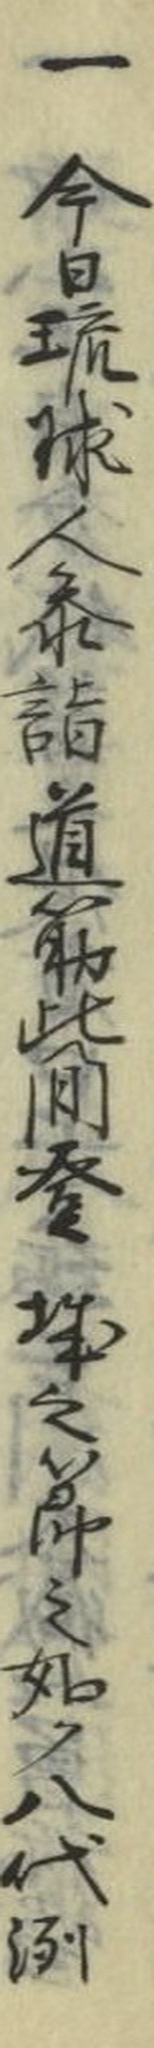一今日琉球人参詣道筋此間登城之節之如く八代州
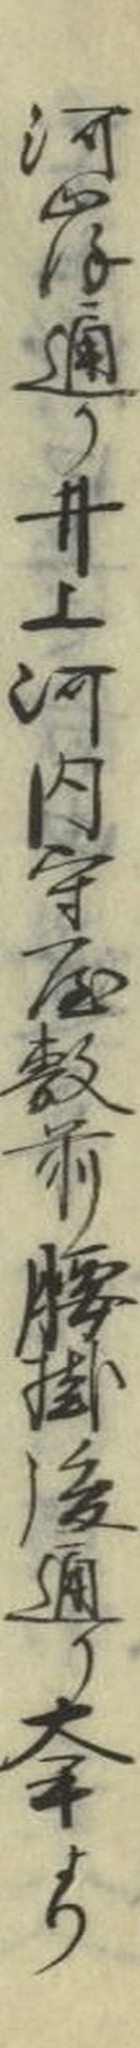河岸通り井上河内守屋敷前腰掛後通り大平より
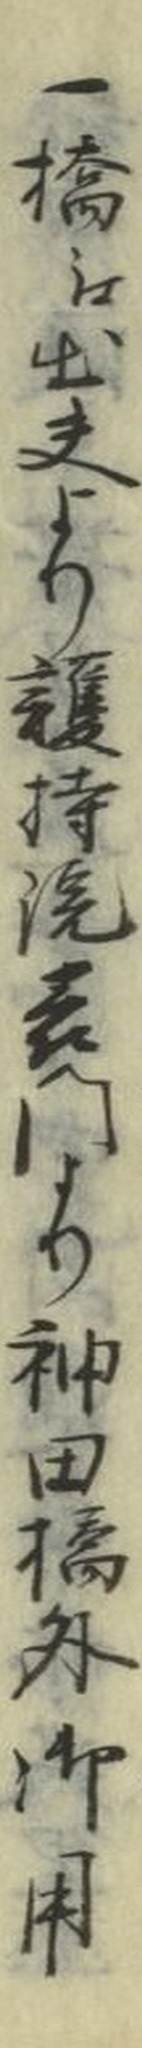一橋え出夫より護持院表門より神田橋外御用
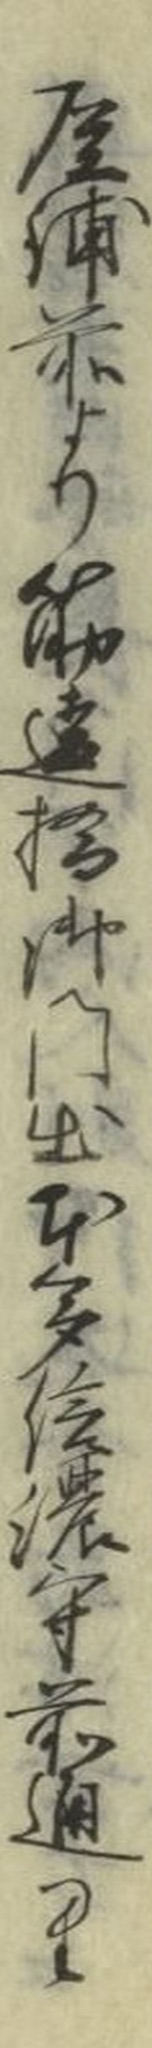屋鋪前より筋違橋御門出本多信濃守前通り
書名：宝永七庚寅年琉球国来聘使日記
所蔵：University of the Ryukyus Library
